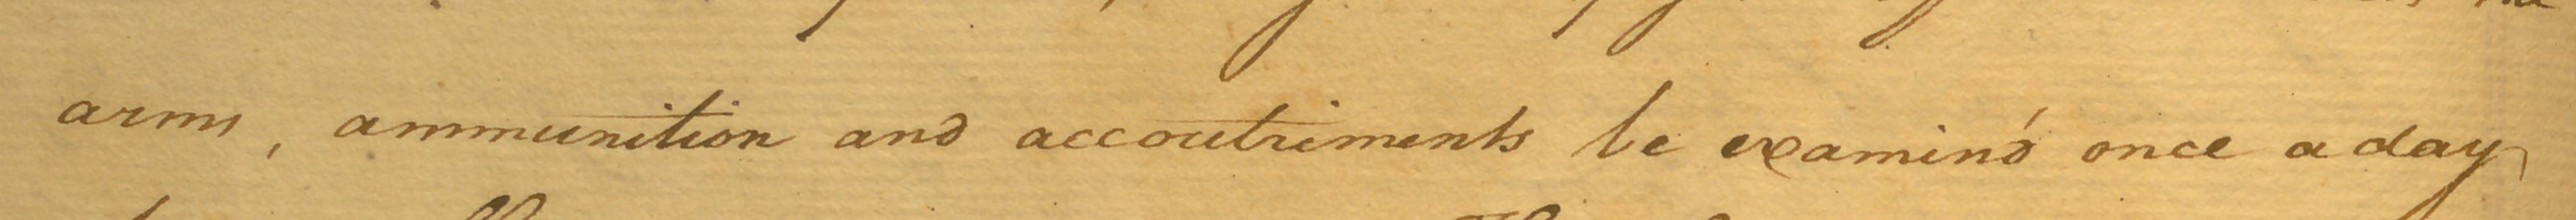arms, ammunition and accoutriments be examin'd once a day,
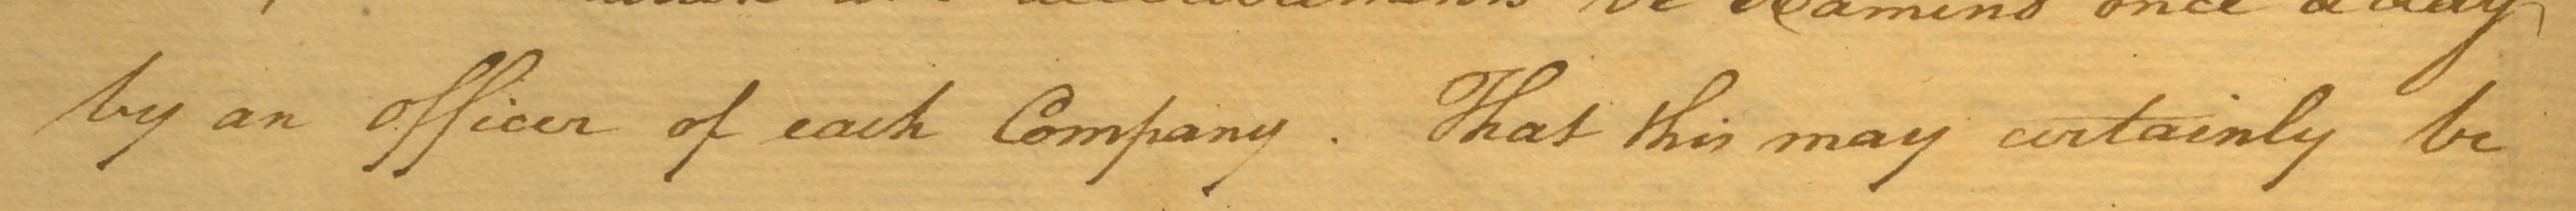by an officer of each Company. That this may certainly be
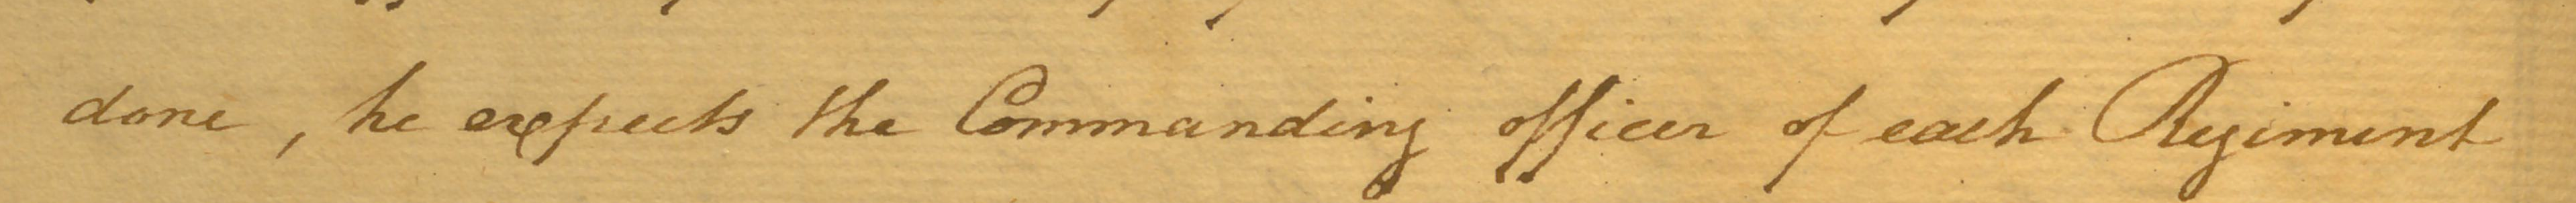done, he expects the Commanding officer of each Regiment
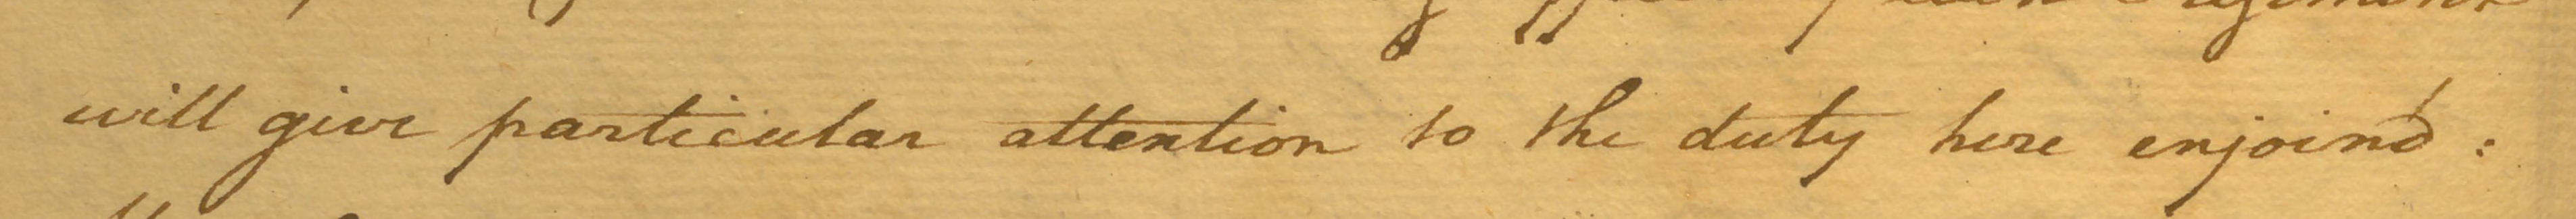will give particular attention to the duty here enjoin'd:
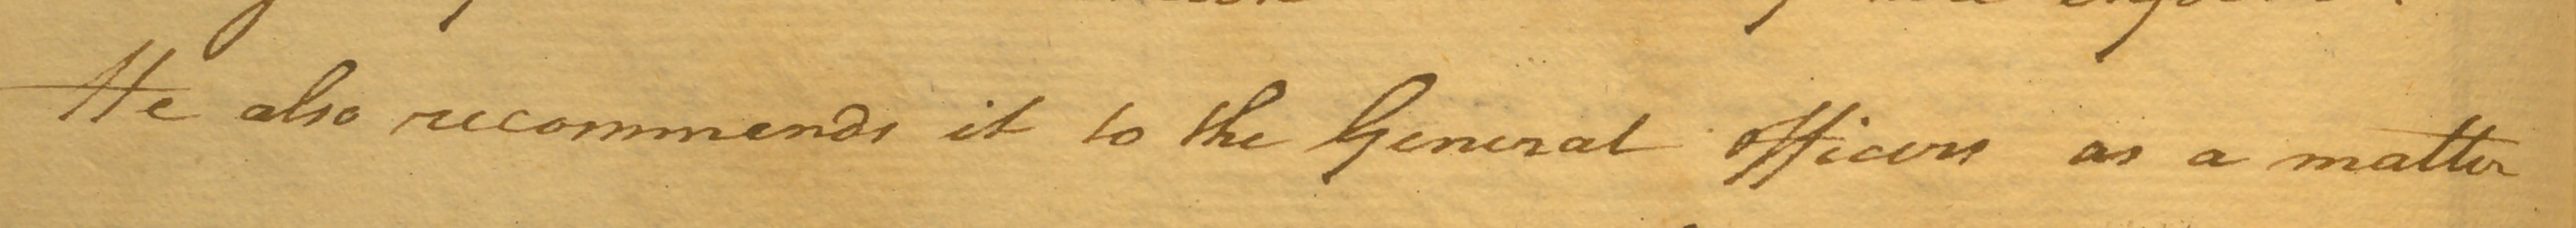He also recommends it to the General officers as a matter
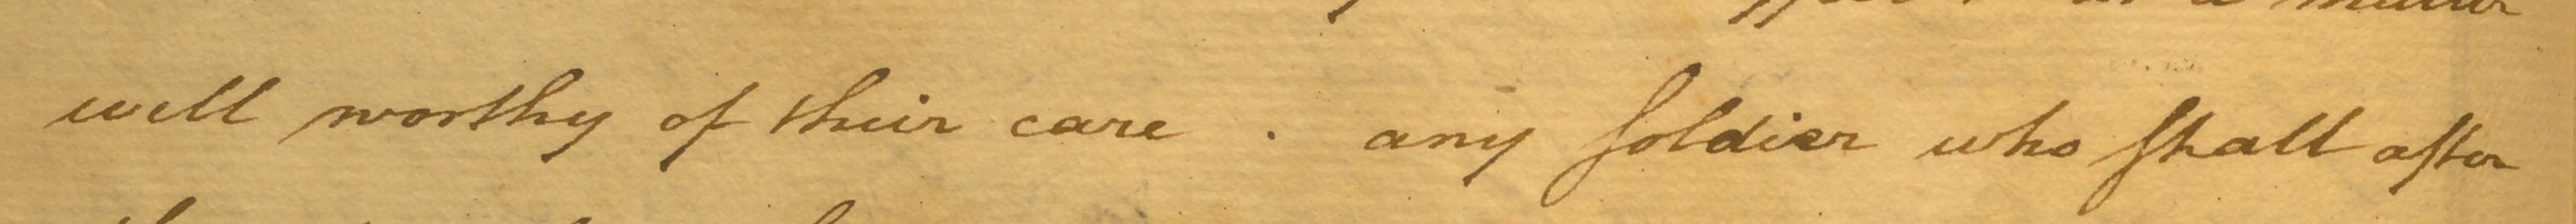well worthy of their care. any Soldier who shall after
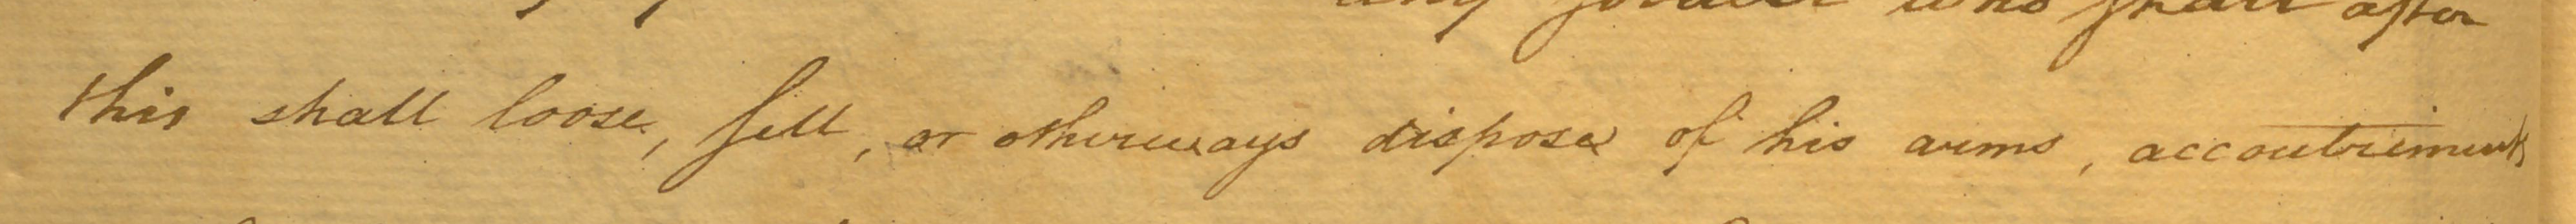this shall loose, fill, or otherways dispose of his arms, accoutriments
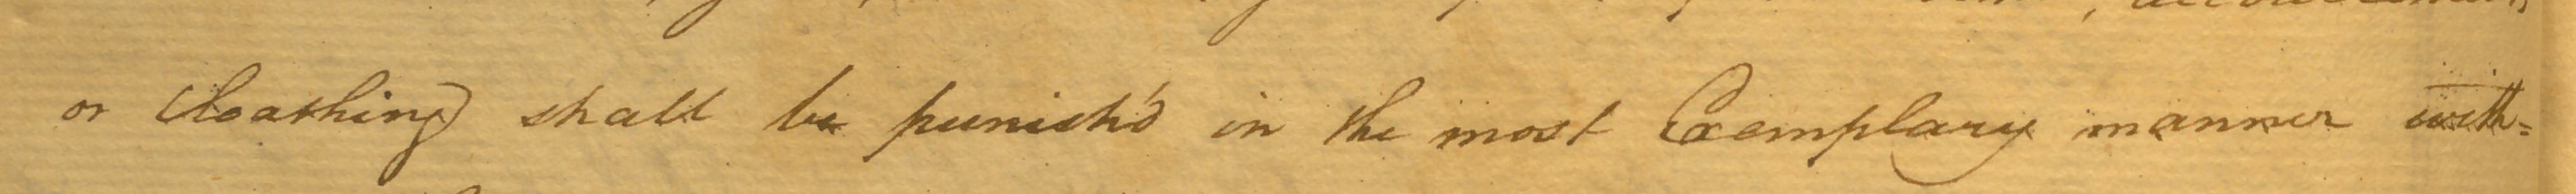or Cloathing shall be punish'd in the most Exemplary manner with-
